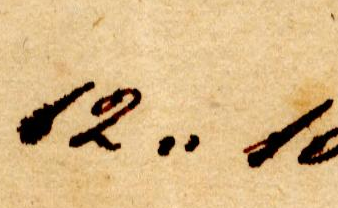12..10
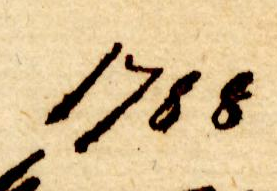1788
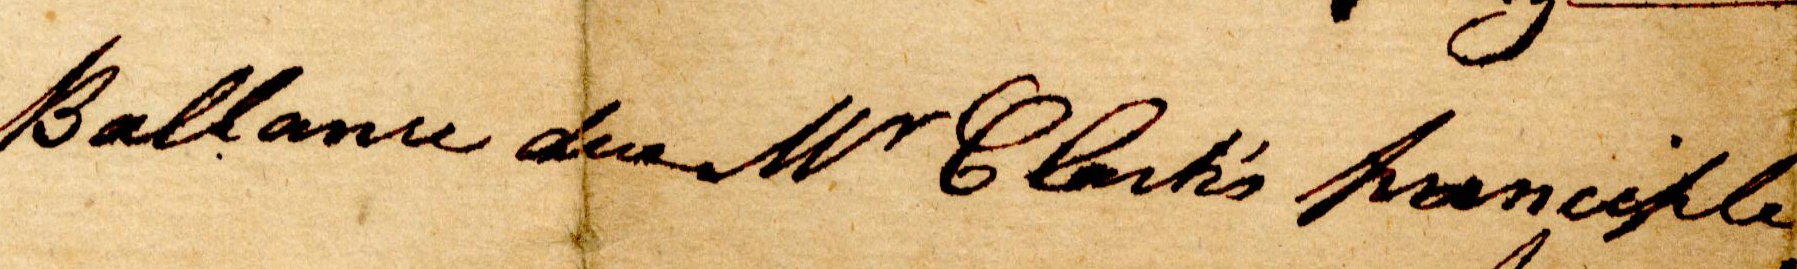Ballance due M^r Clarks principle
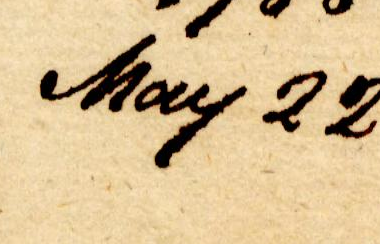May 22
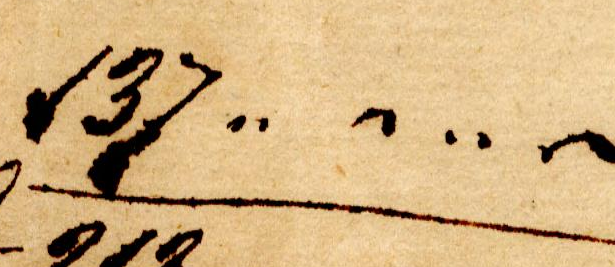137..-..-
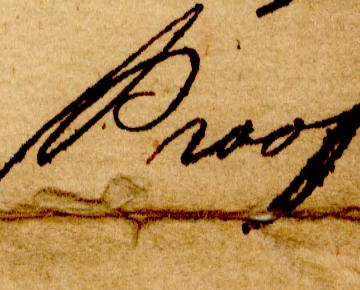Proof
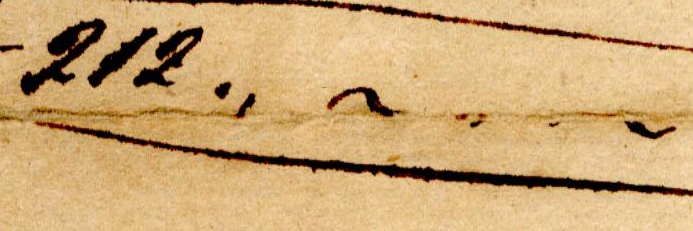212..-..-
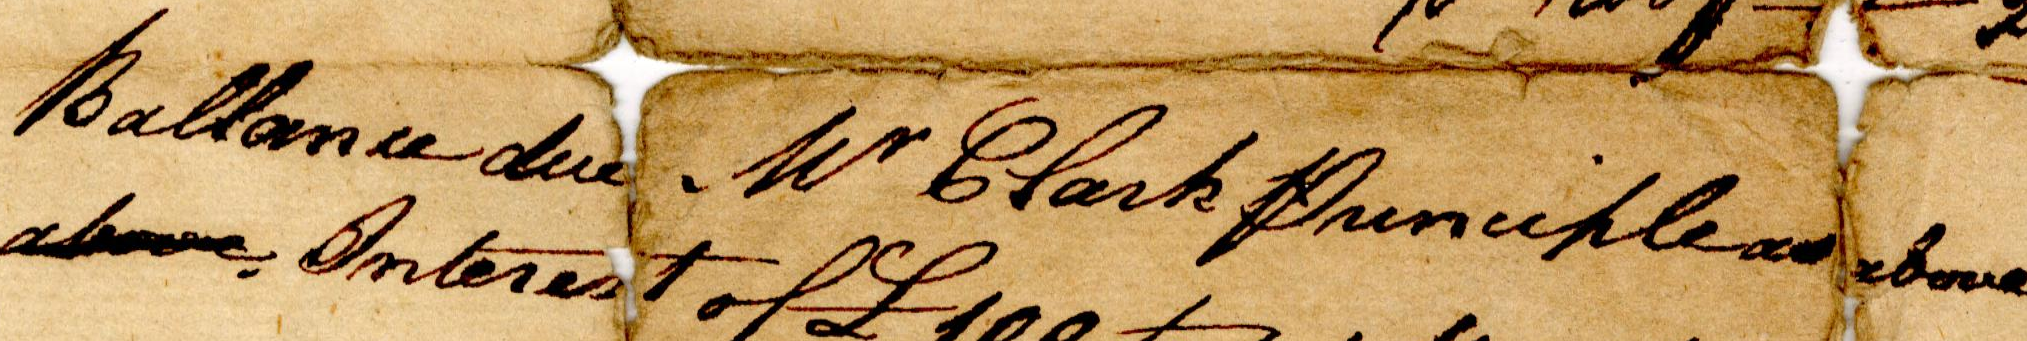Ballance due M^r Clark Principle above
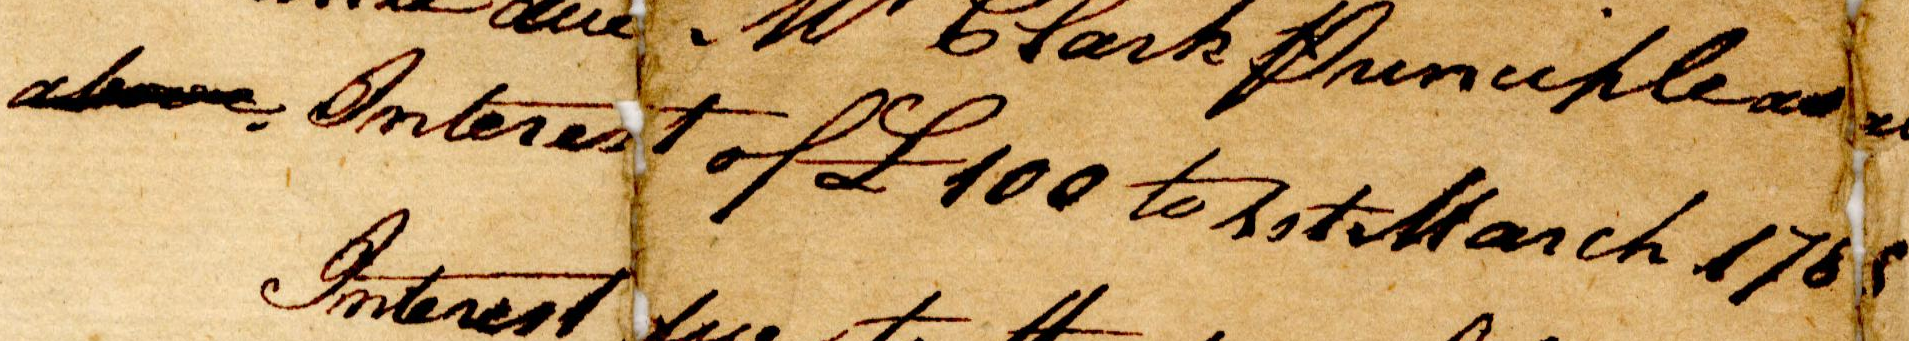[above] interest of £100 to 1st March 1788
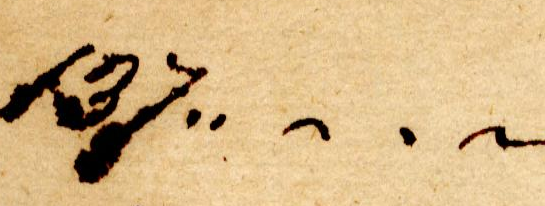137..-..-
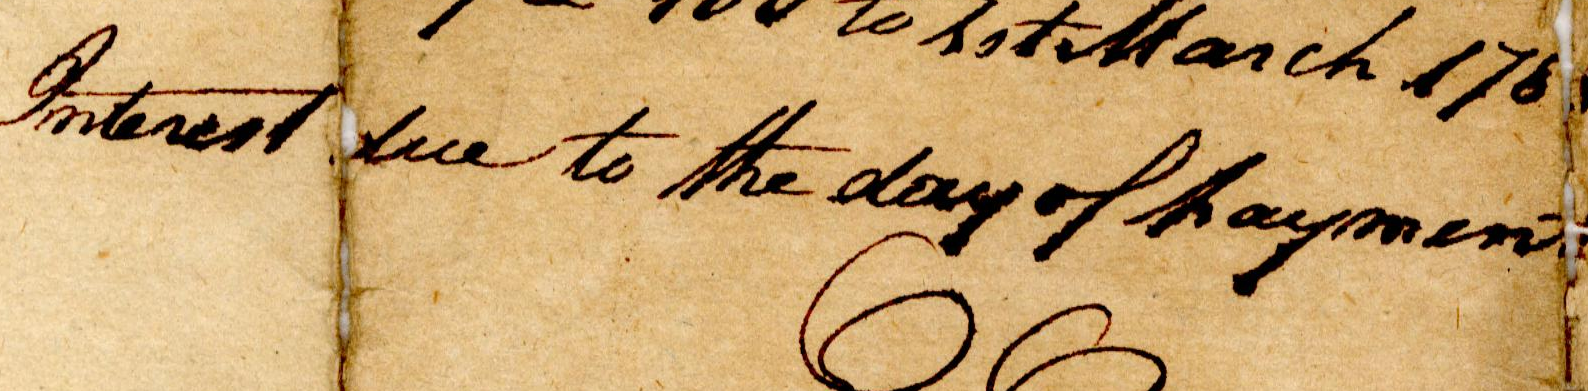Interest due to the day of payment
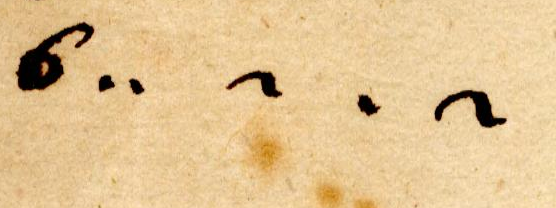6..-..-
